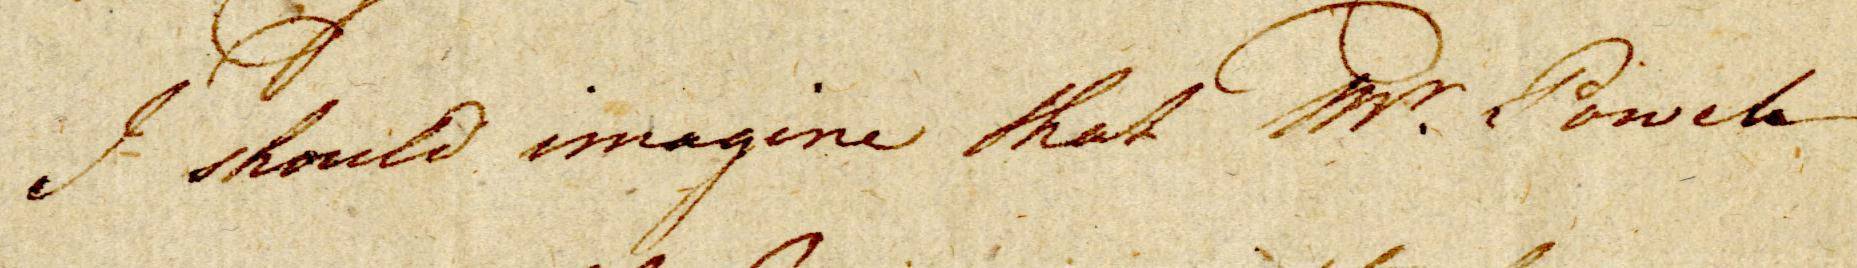I should imagine that M^r. Powele
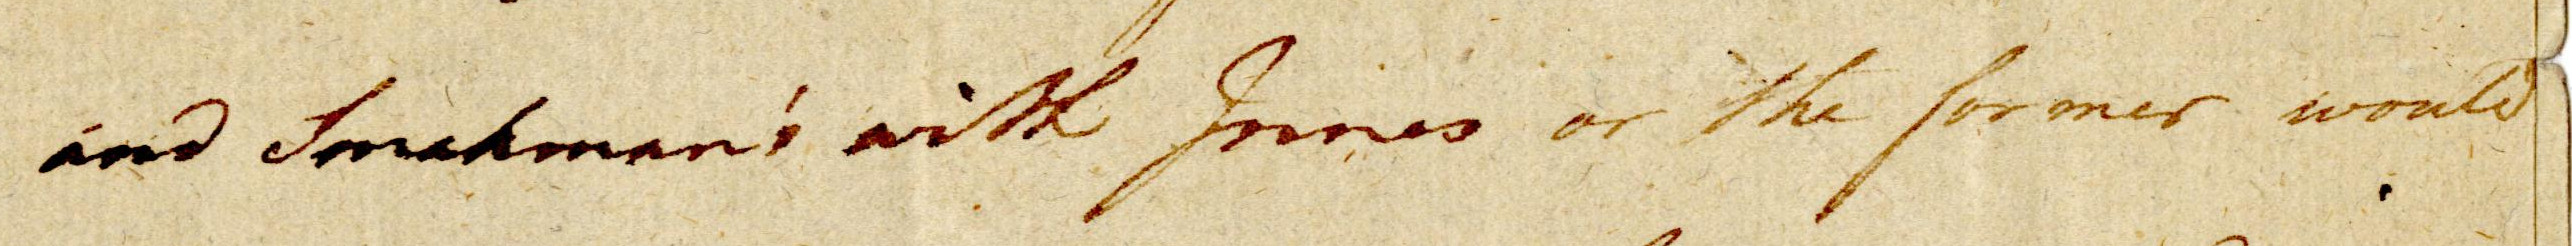and Smalman's with Jones or the former would
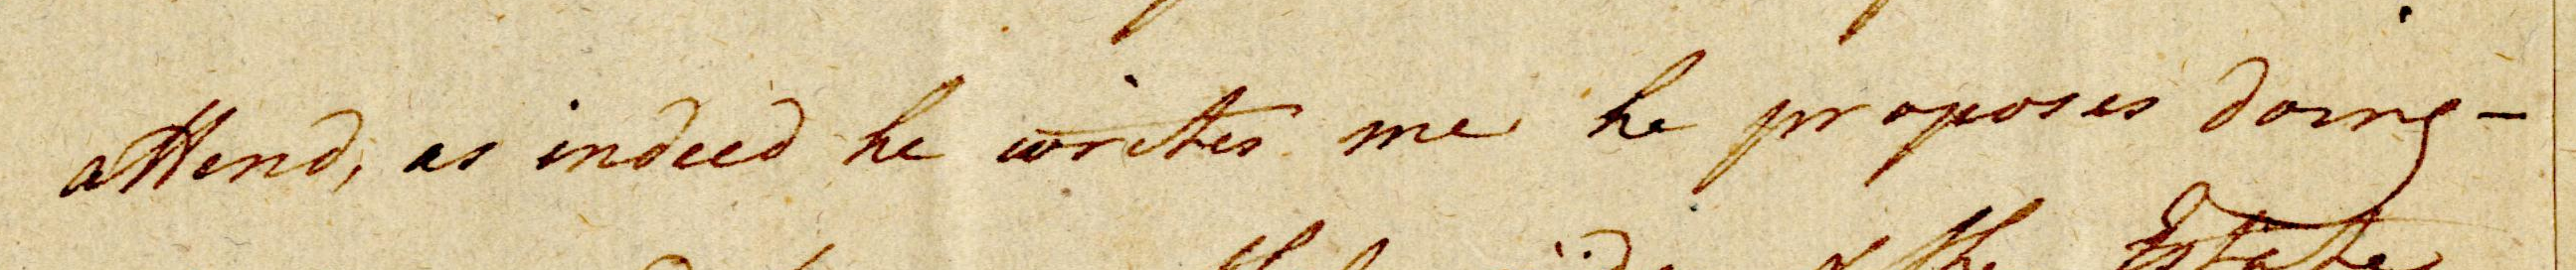attend, as indeed he writes me he proposes doing-
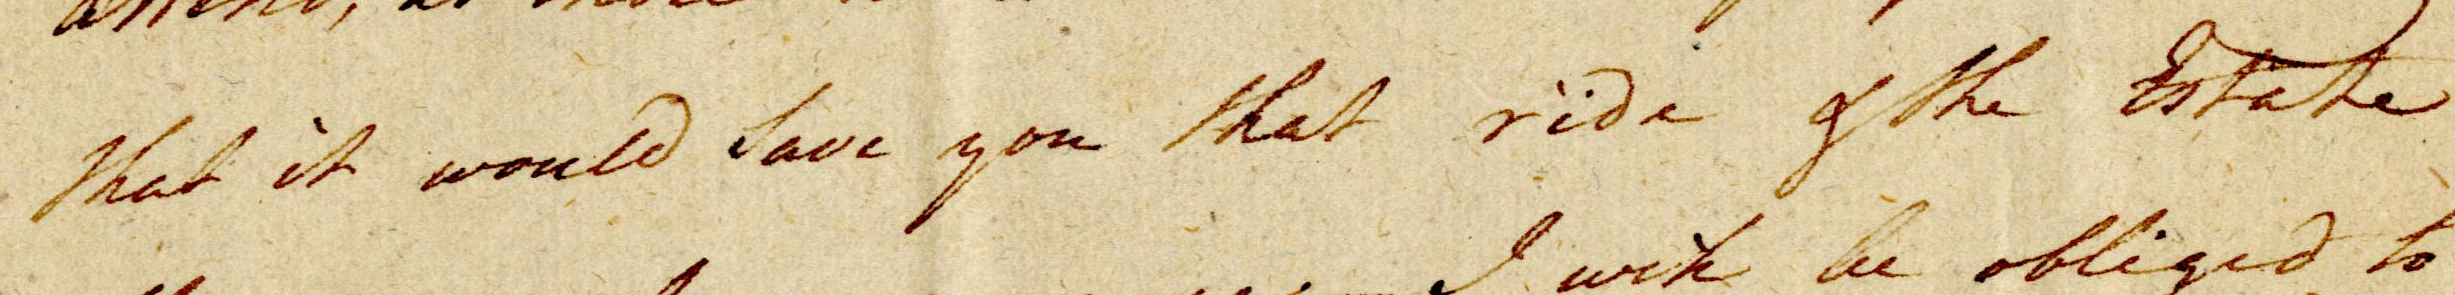that it would save you that ride & the Estate
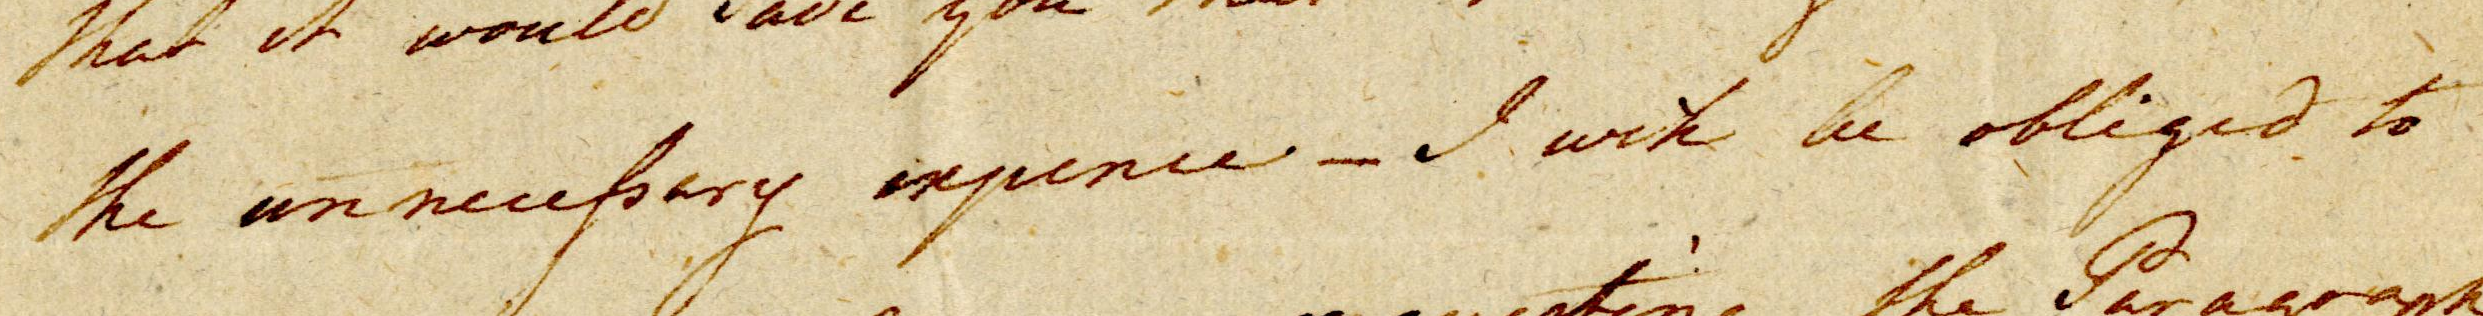the unnecessary expense- I will be obliged to
